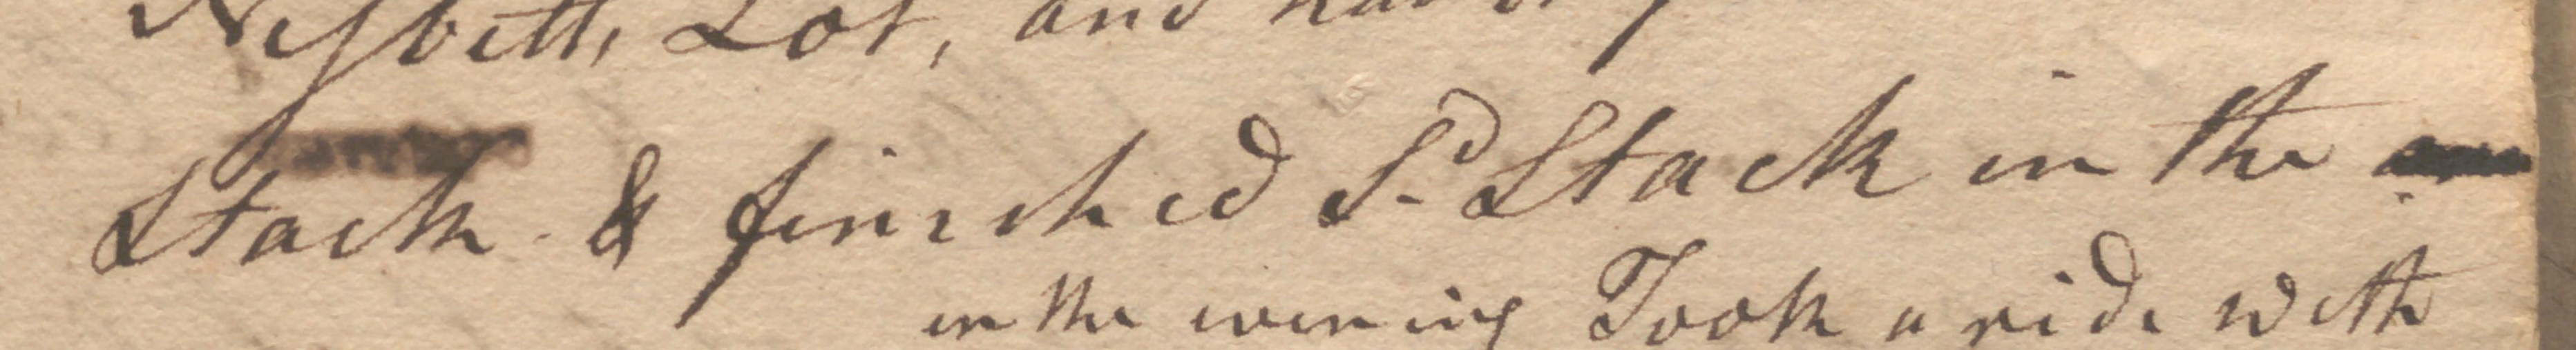Stack & finished s^d. Stack in the [ar]
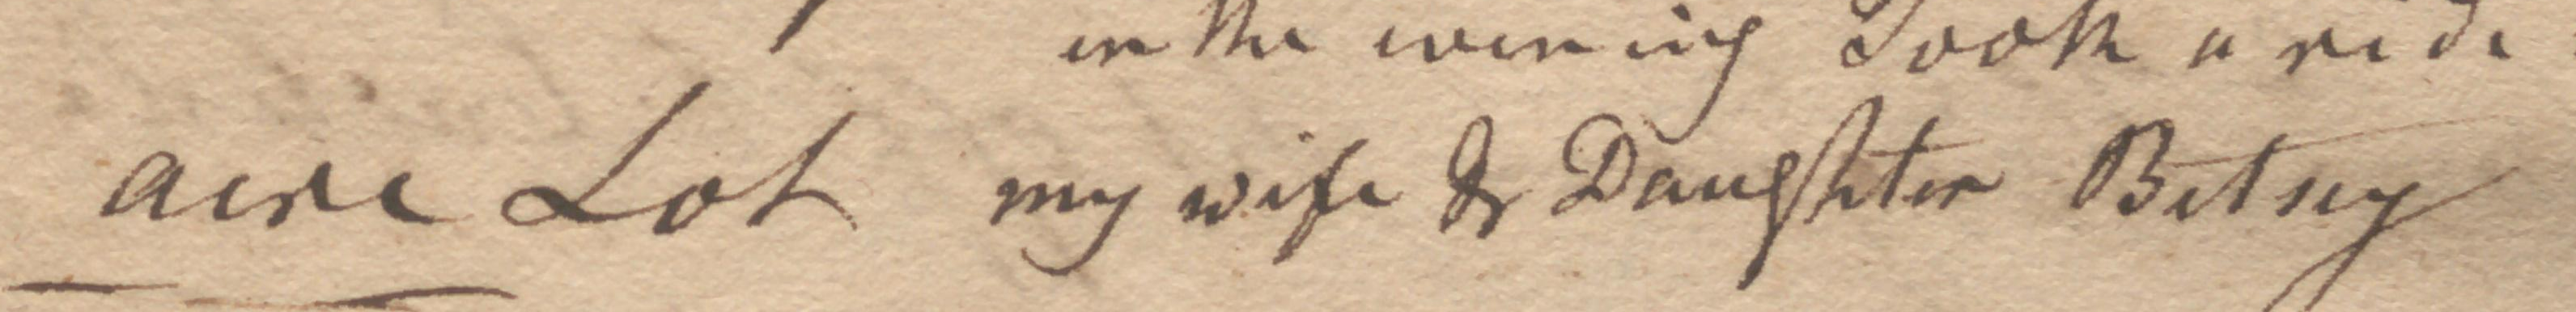acre Lot my wife & Daughter Betsey
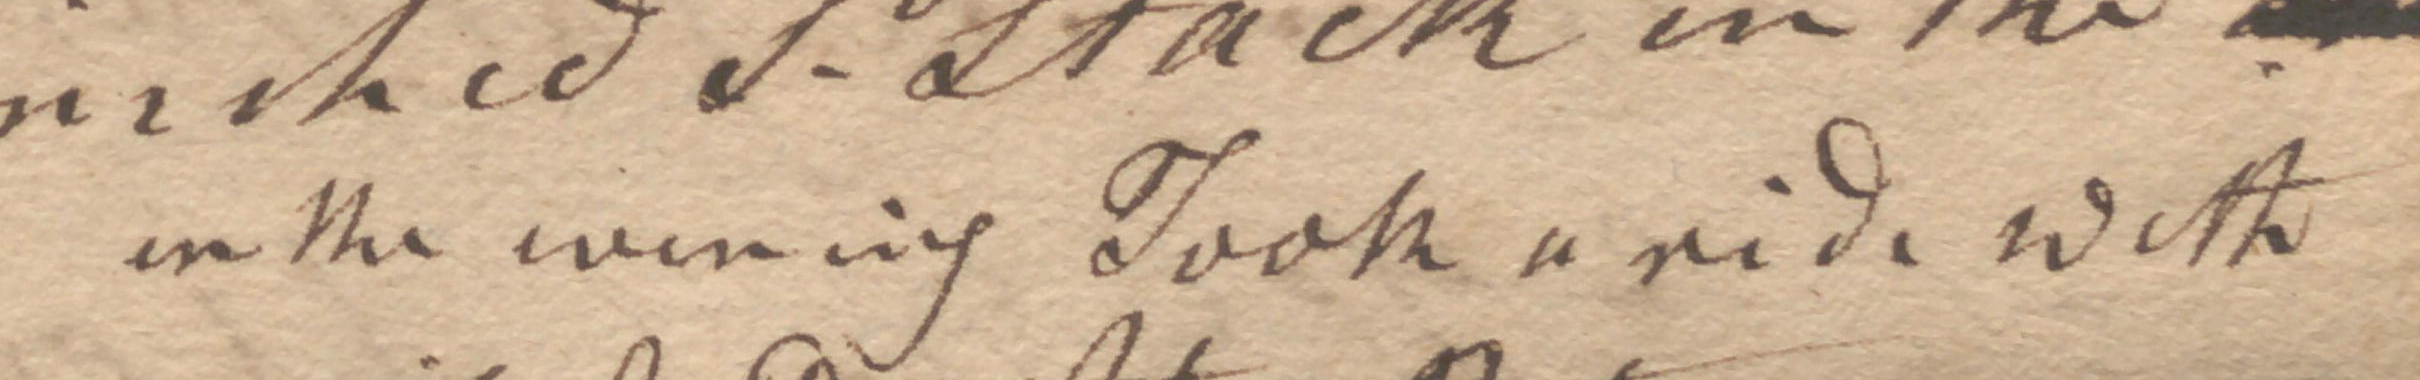in the evening Took a ride with
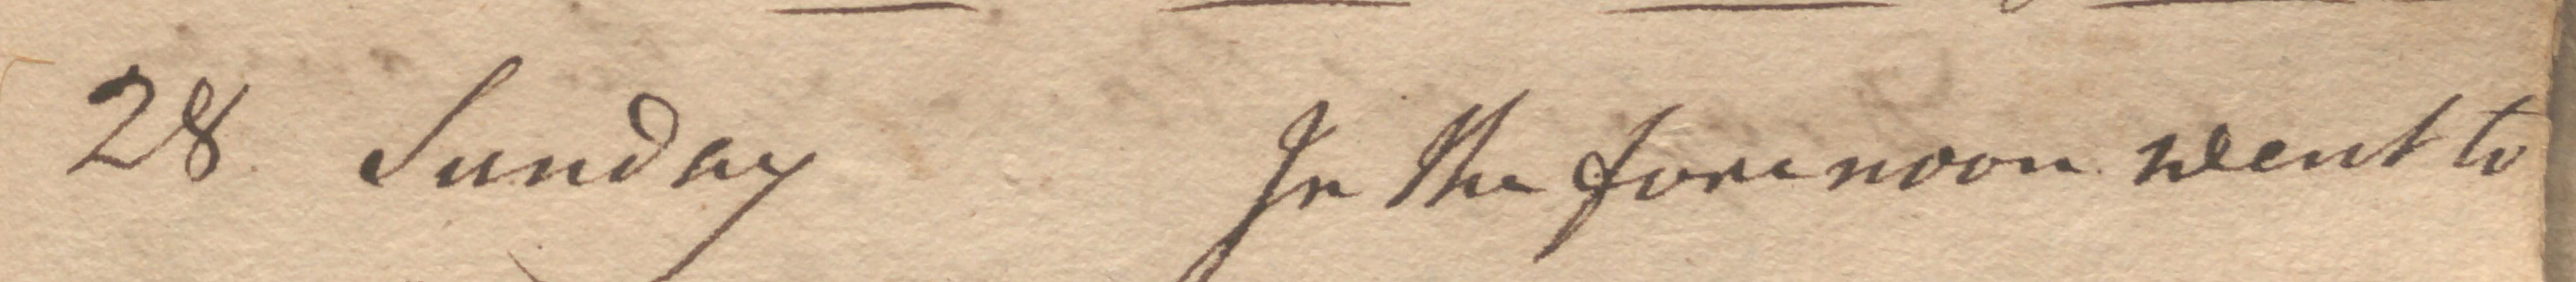28 Sunday In the forenoon went to
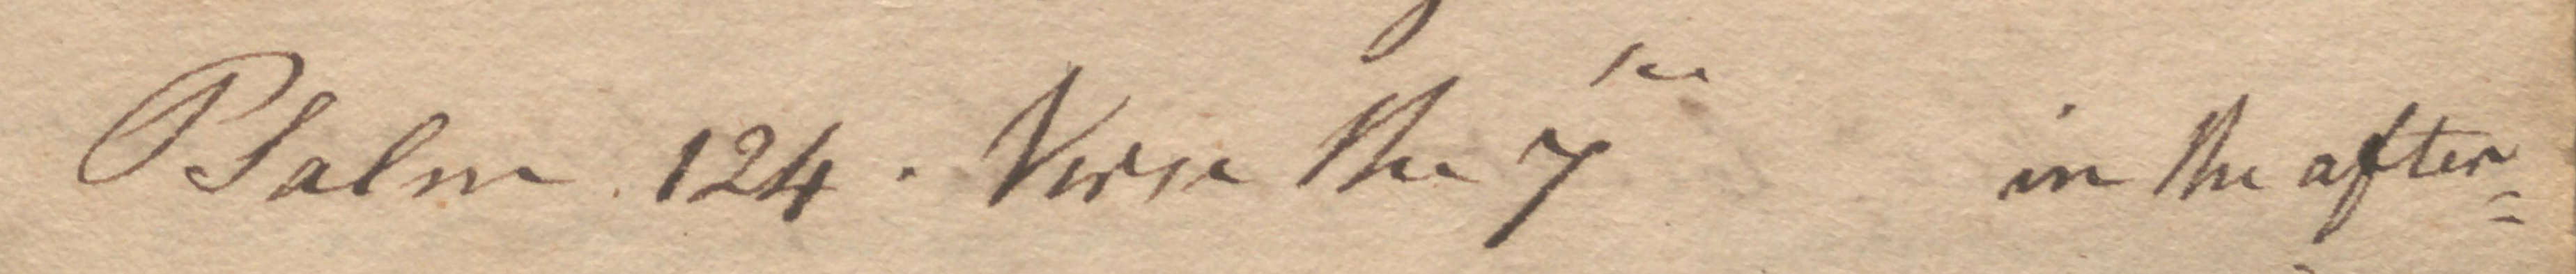Psalm 124^th. Verse the 7^th in the after
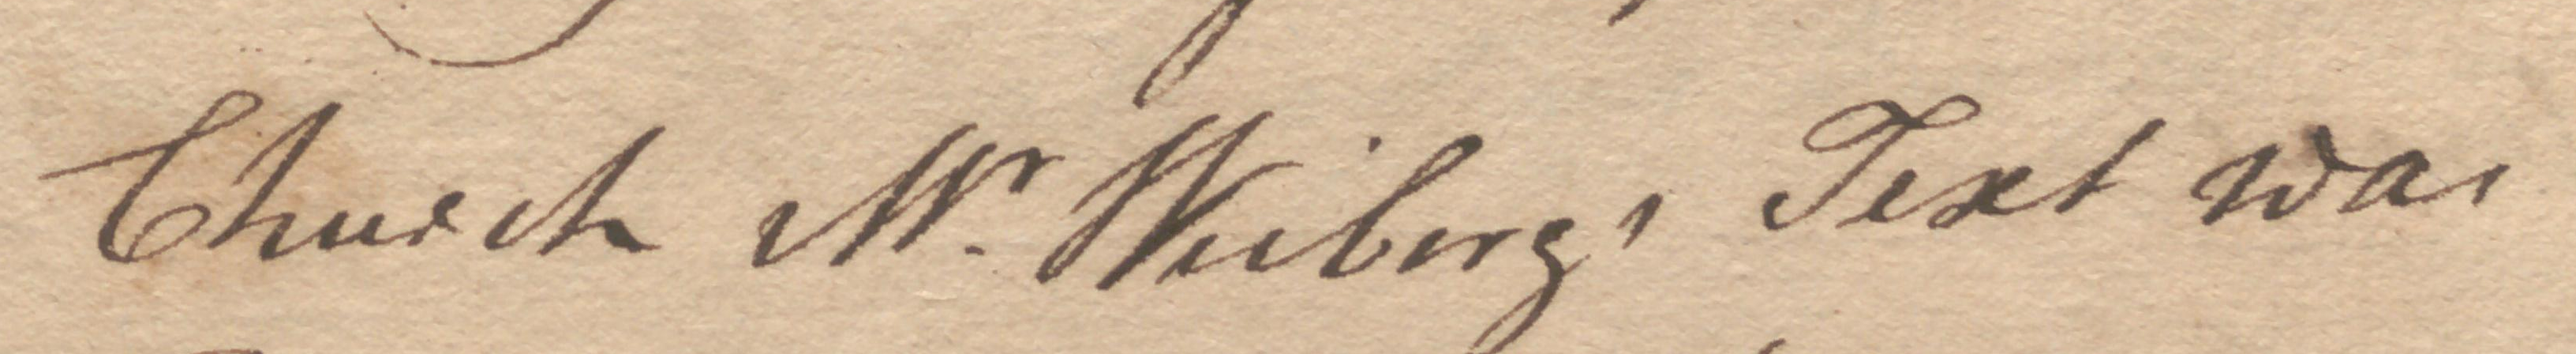Church M^r. Weibergs Text was
